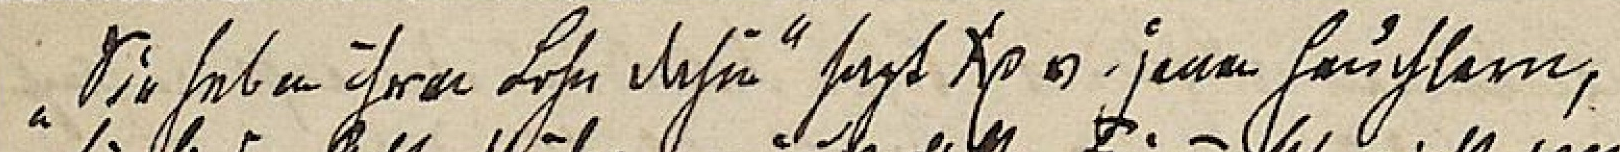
"Sie haben ihren Lohn dafür" sagt Χρ v. jenen Heuchlern,
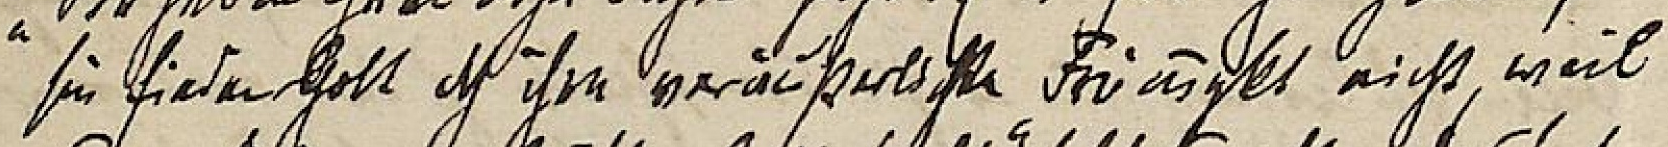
sie finden Gott dch ihre veräußerlichte Frömigkt nicht, weil
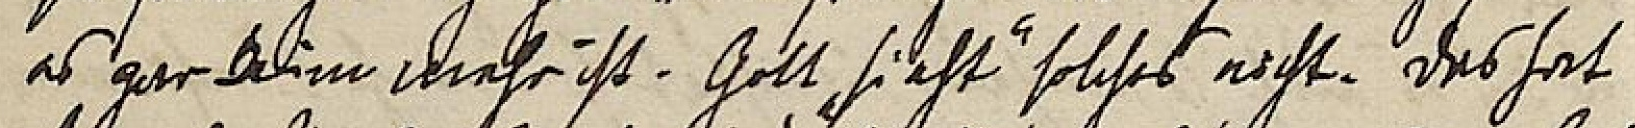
es gar keine mehr ist. Gott "sieht" solches nicht. Das hat
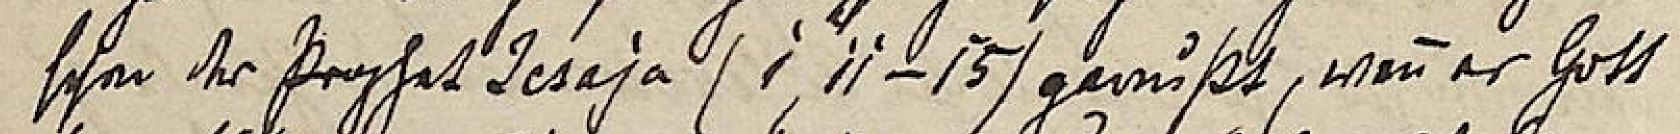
schon der Prophet Jesaj (1,11-15) gewußt, wen er Gott
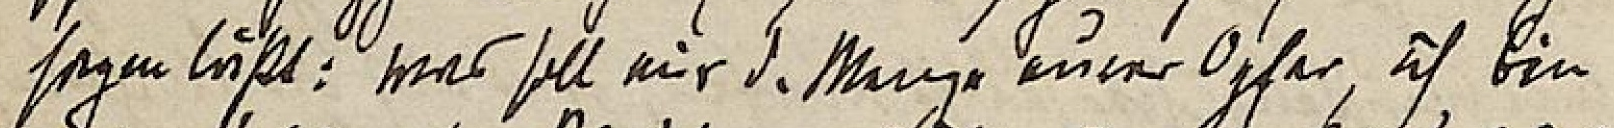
sagen läßt: was soll nur d. Menge eurer Opfer, ich bin
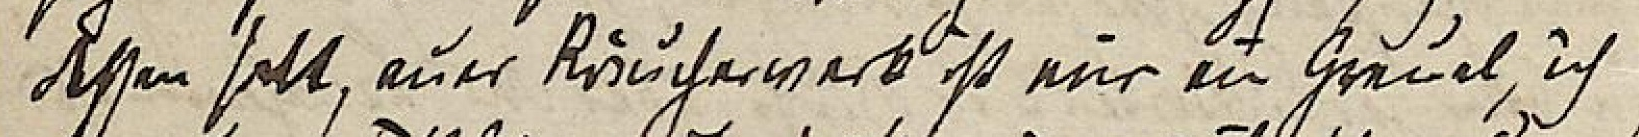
dessen satt, euer Räucherwerk ist nur ein Greuel, ich
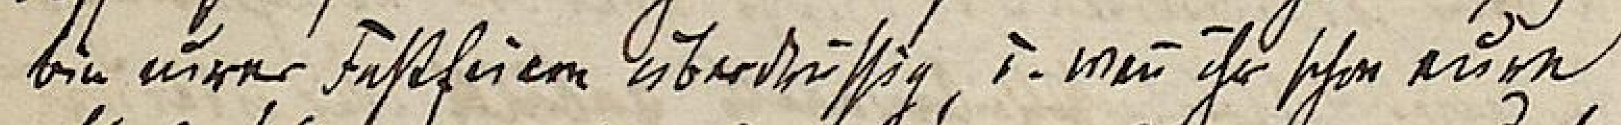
bin eurer Festfeiern überdrüssig, u. wen ihr schon eure
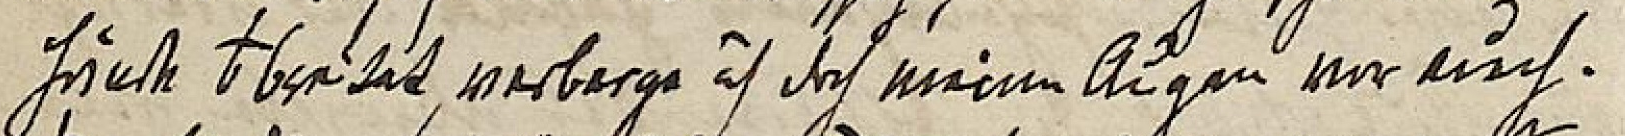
Häute sbreitet, verberg ich doch meine Augen vor euch.
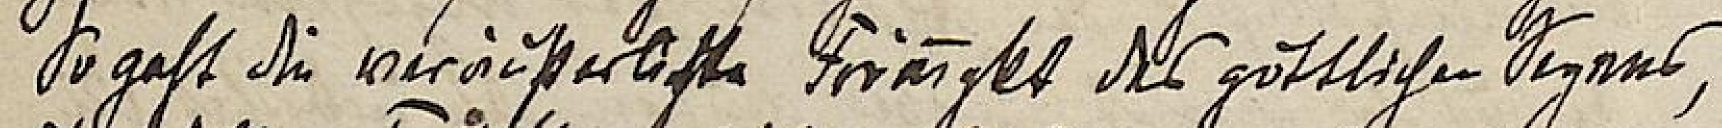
So geht die veräußerlichte Frömigkt des göttlichen Segens,
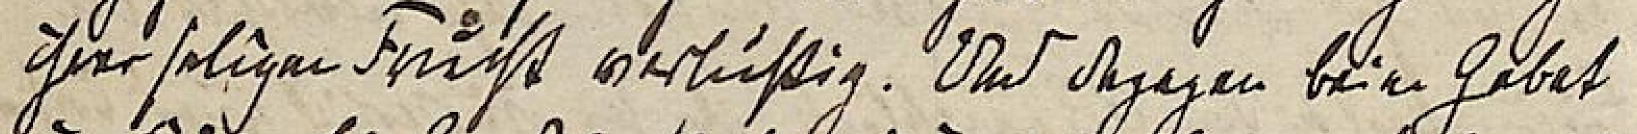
ihrer seligen Frucht verlustig. Und dagegen beim Gebet
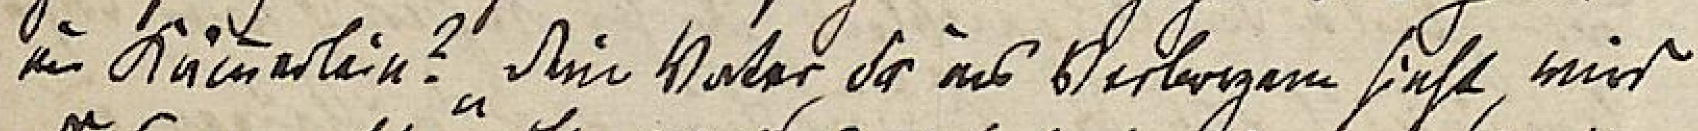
im Kämerlein? "Dein Vater, der ins Verborgene sieht, wird
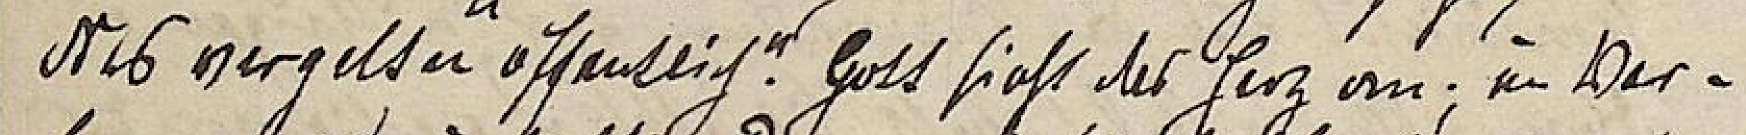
dirs vergelten öffentlich" Gott sieht das Herz an; im Ver¬
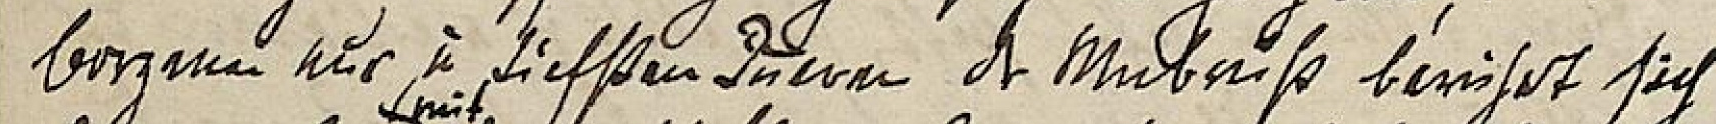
borgenen aus, im tiefsten Inern dr Mnbrust bewährt sich
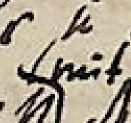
mit
